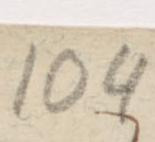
104
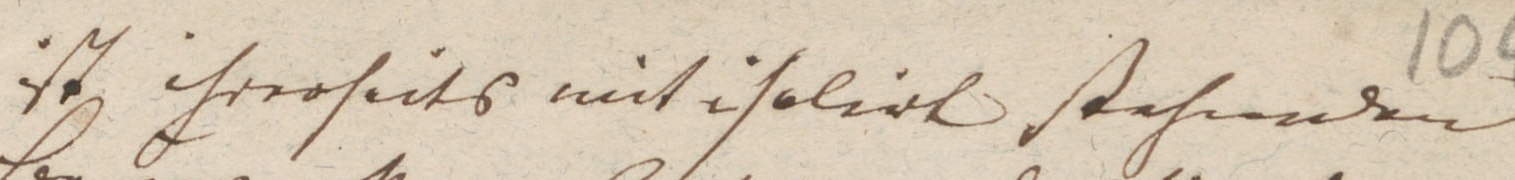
ist ihrerseits mit isolirt stehenden
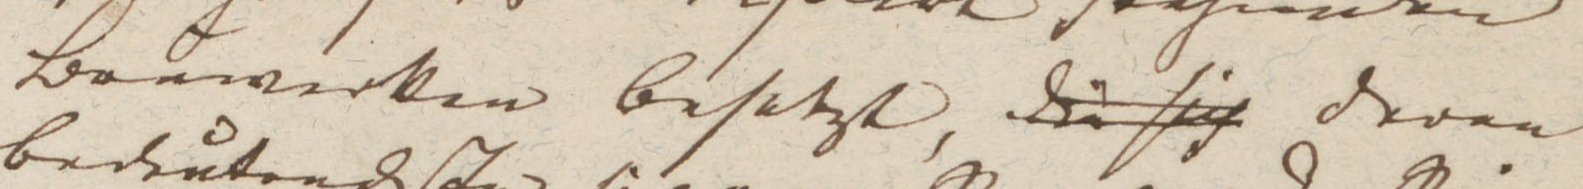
Bauwerken besetzt, die sich deren
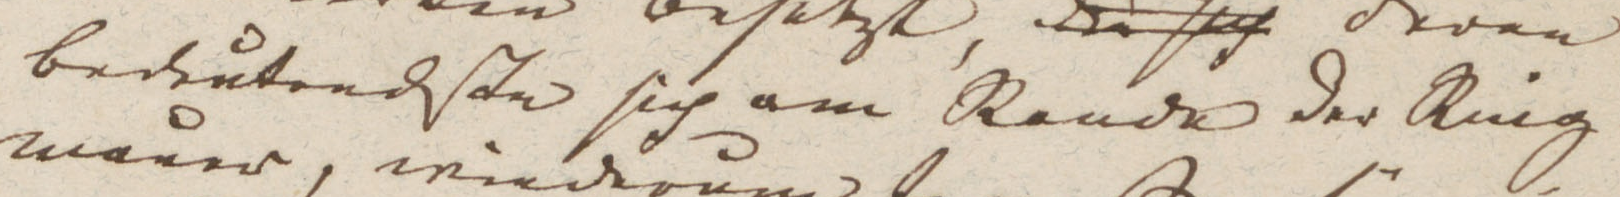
bedeutendste sich am Rande der Ring-
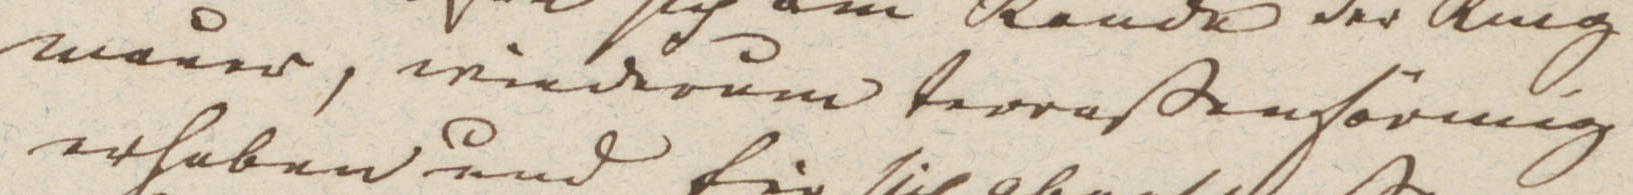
mauer, wiederum terrassenförmig
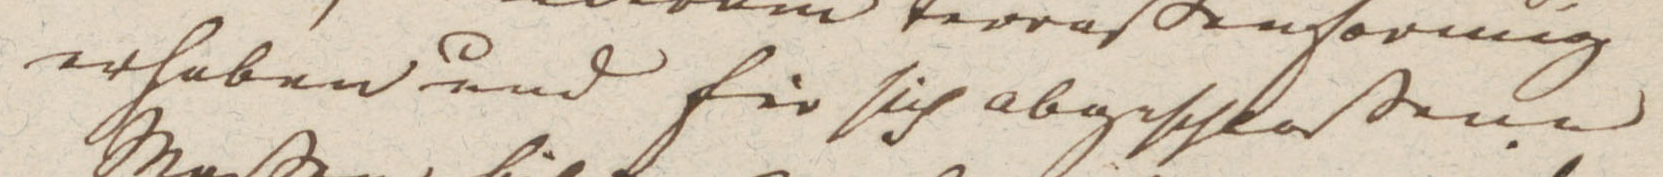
erheben und für sich abgeschlossene
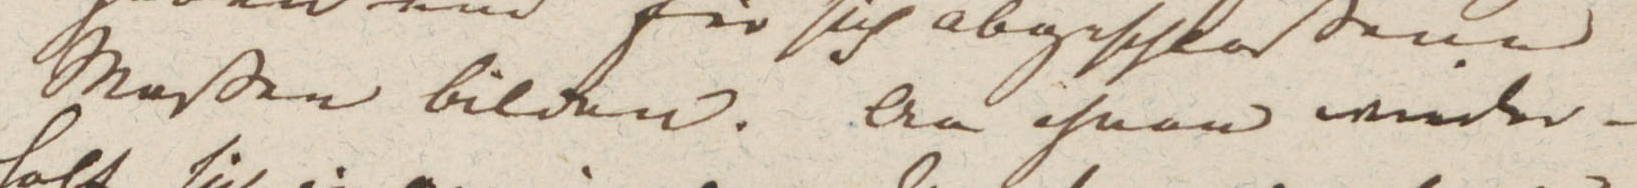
Massen bilden. An ihnen wieder-
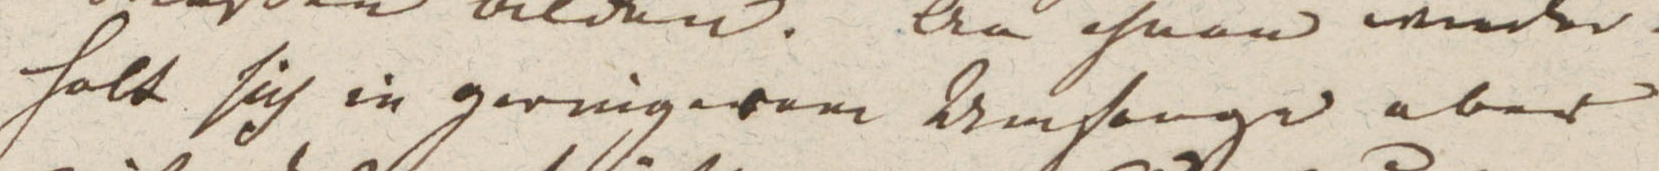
holt sich in gereingerem Umfange aber
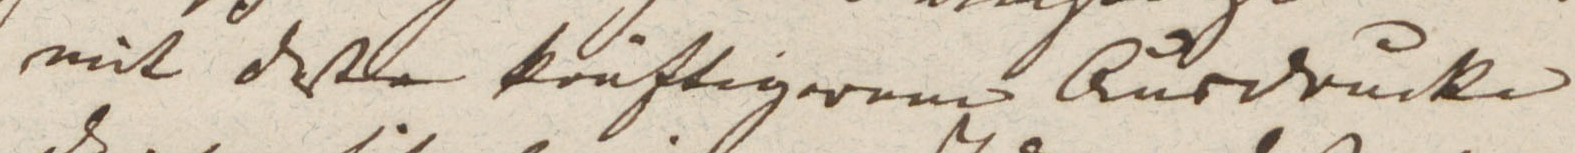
mit desto kräftigerem Ausdrucke
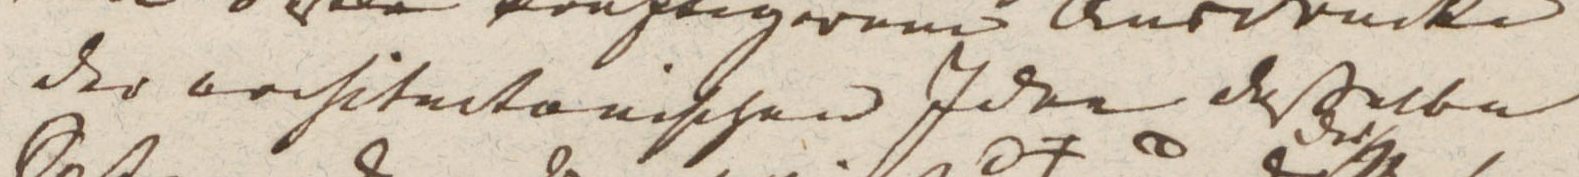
der architectonischen Idee dasselbe
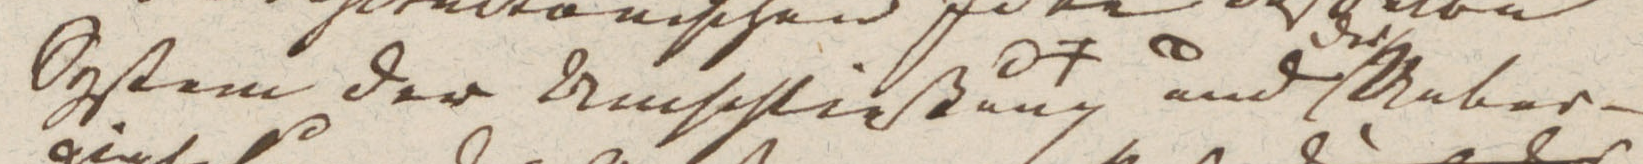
System der Umschliessung % und der Ueber-
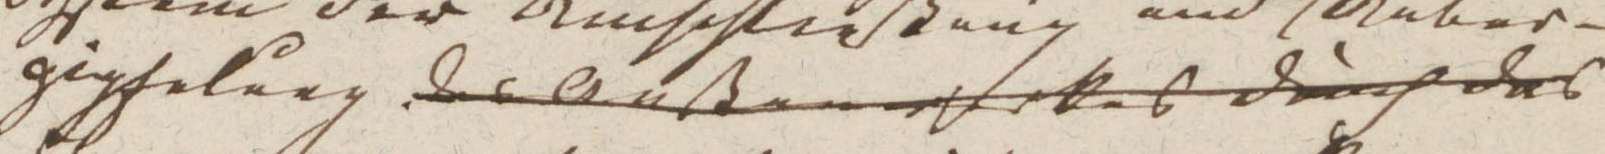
gipfelung des Aussenwerkes durch das
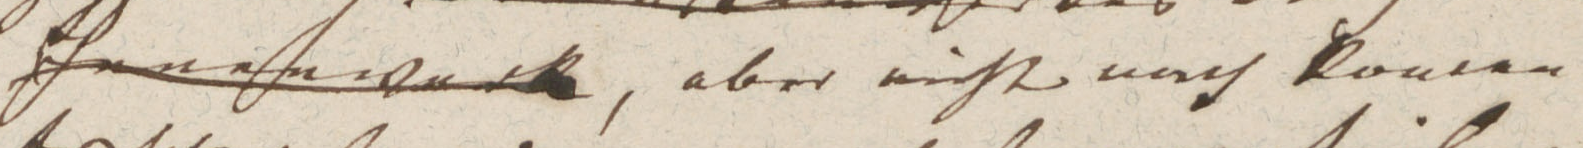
Innenwerk, aber nicht nach koncen-
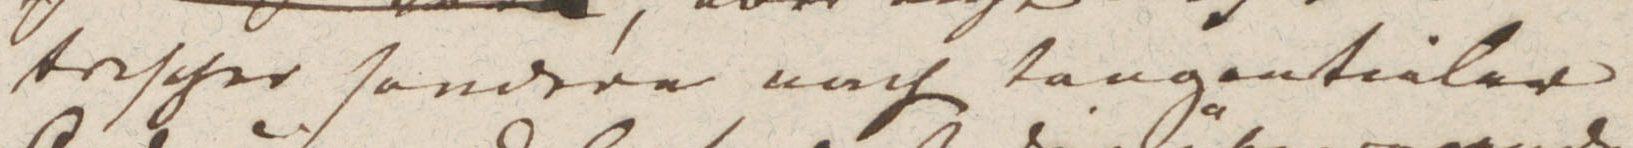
trischer sondern nach tangentialer
